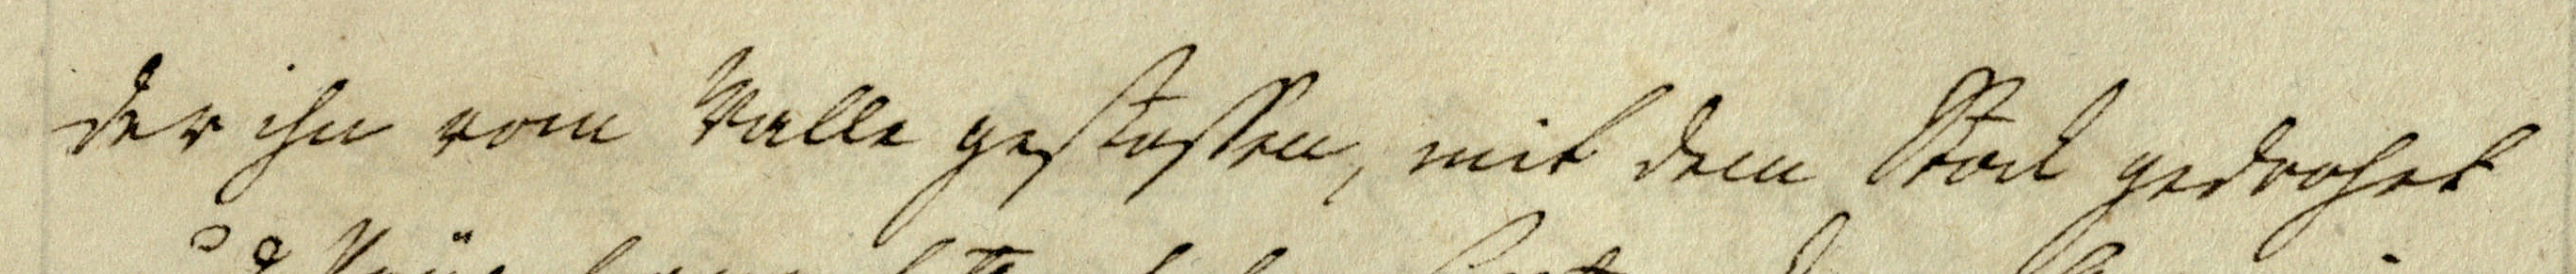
der ihn vom Walle gestossen, mit dem Stock gedrohet
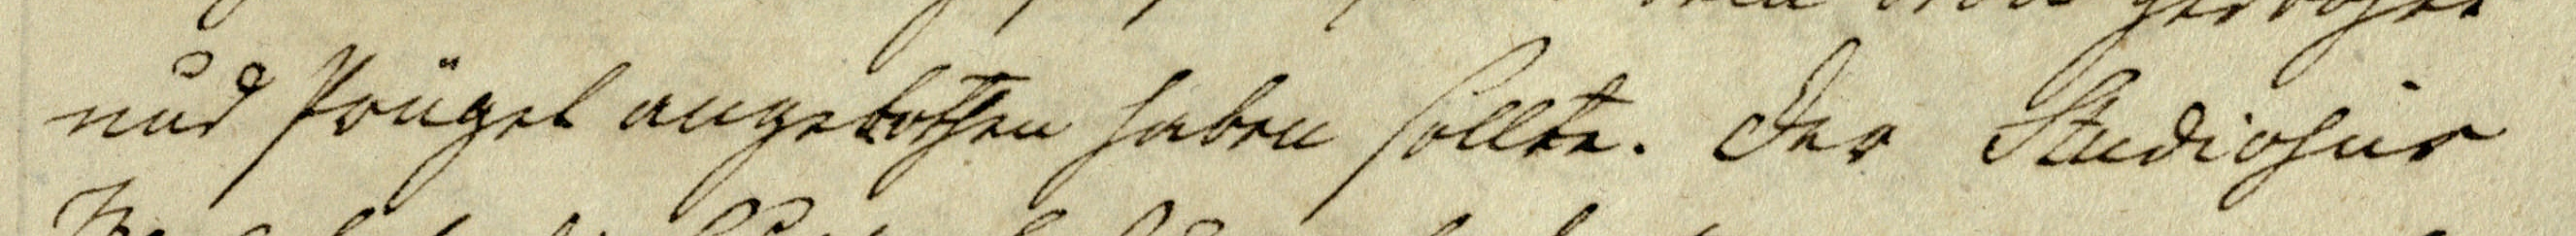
und Prügel angebothen haben sollte. Der Studiosus
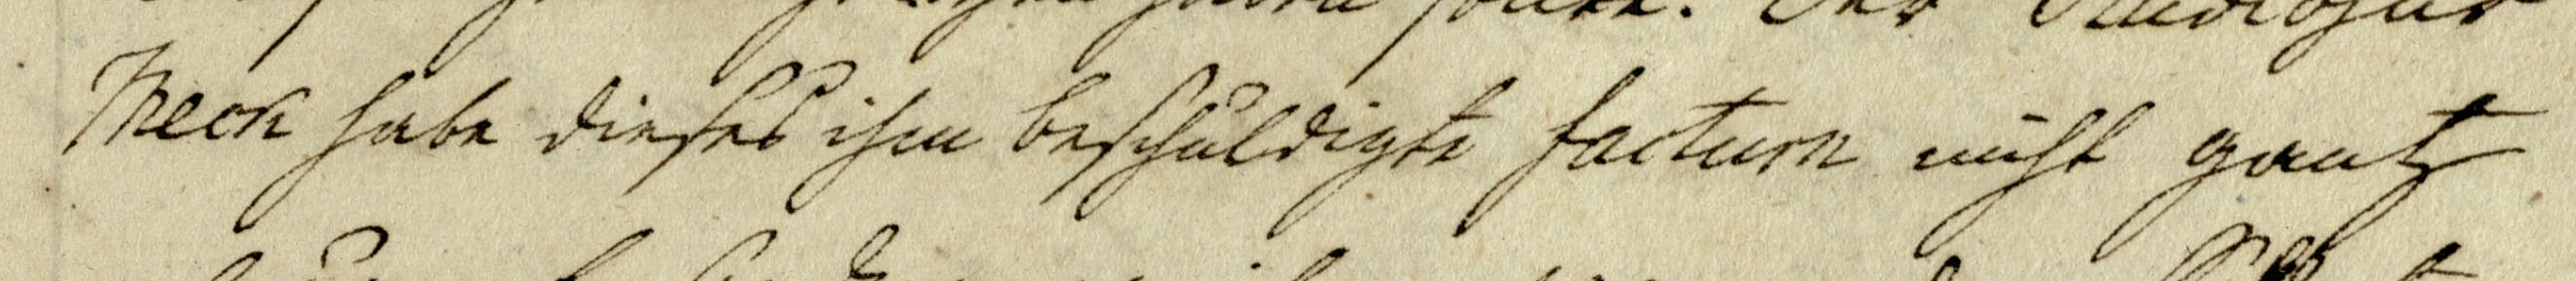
Meck habe dieses ihm beschuldigte Factum nicht gantz
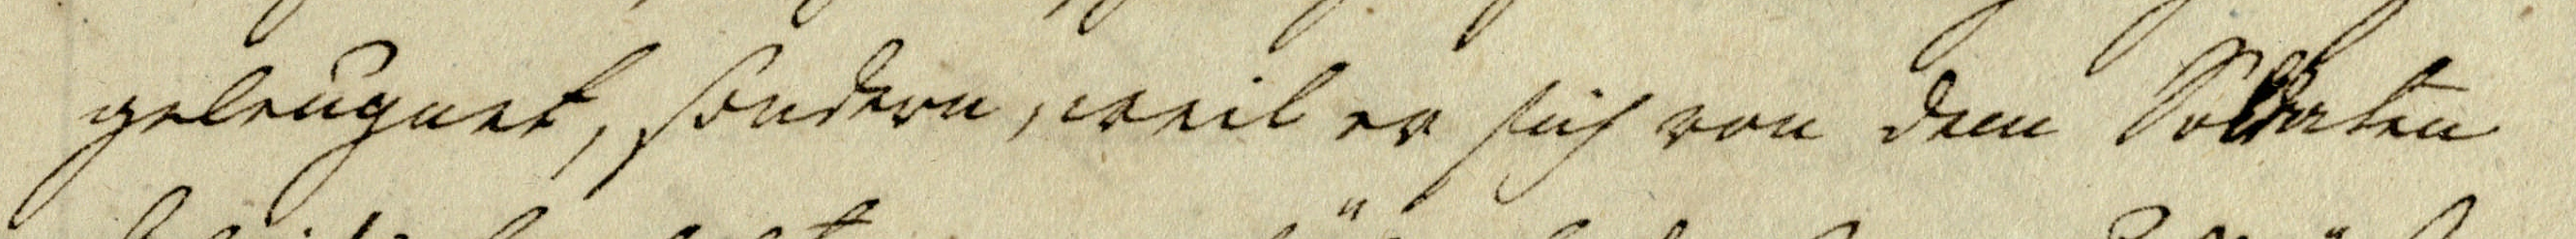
geleugnet, sondern, weil er sich von dem Soldaten
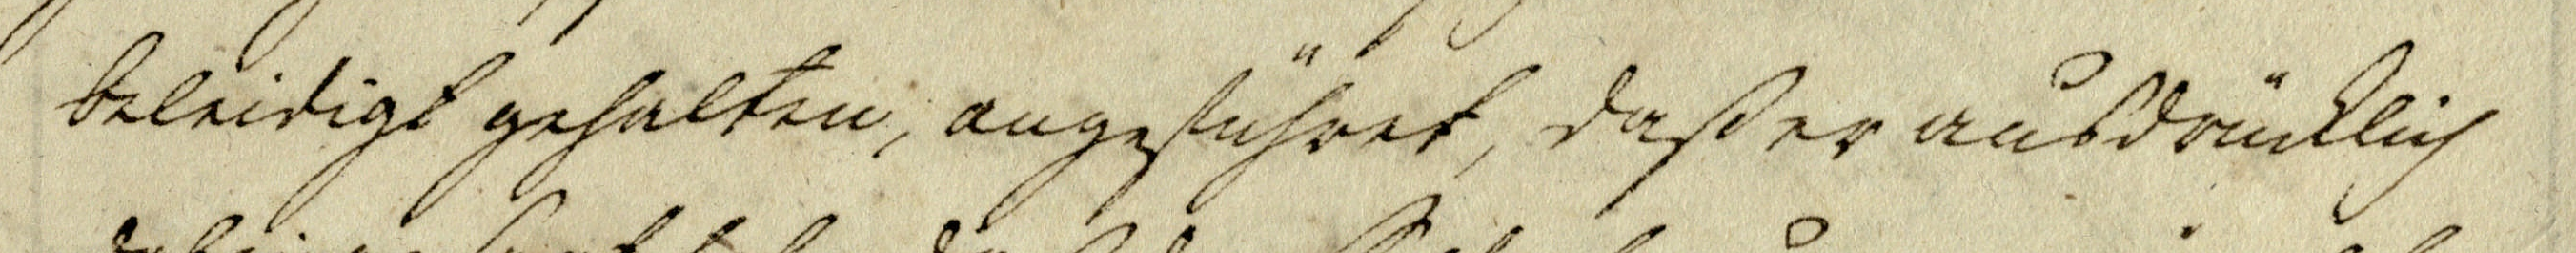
beleidigt gehalten, angeführet, daß er ausdrücklich
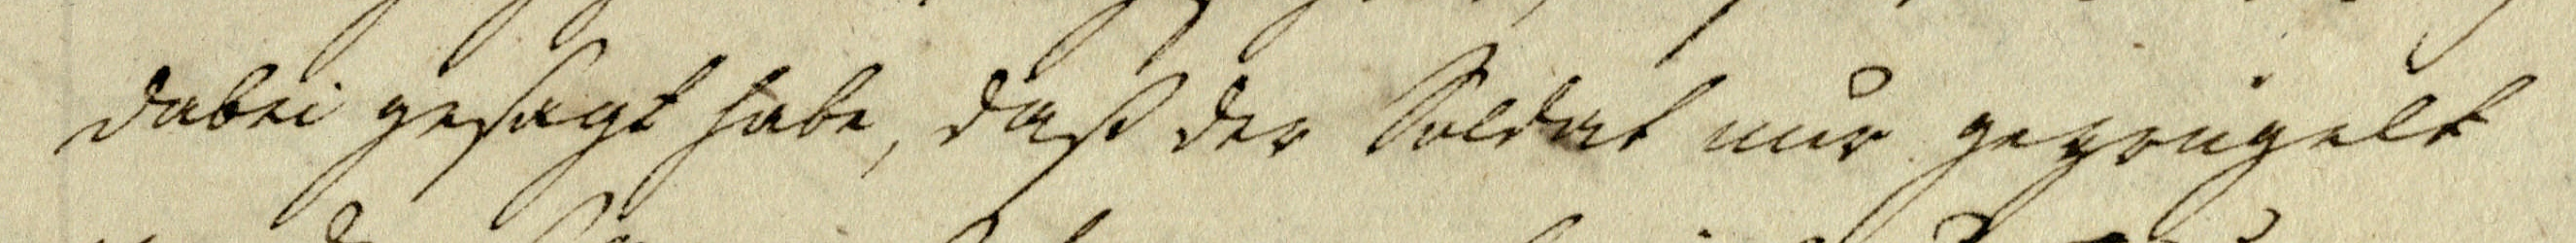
dabei gesagt habe, daß der Soldat nur geprügelt
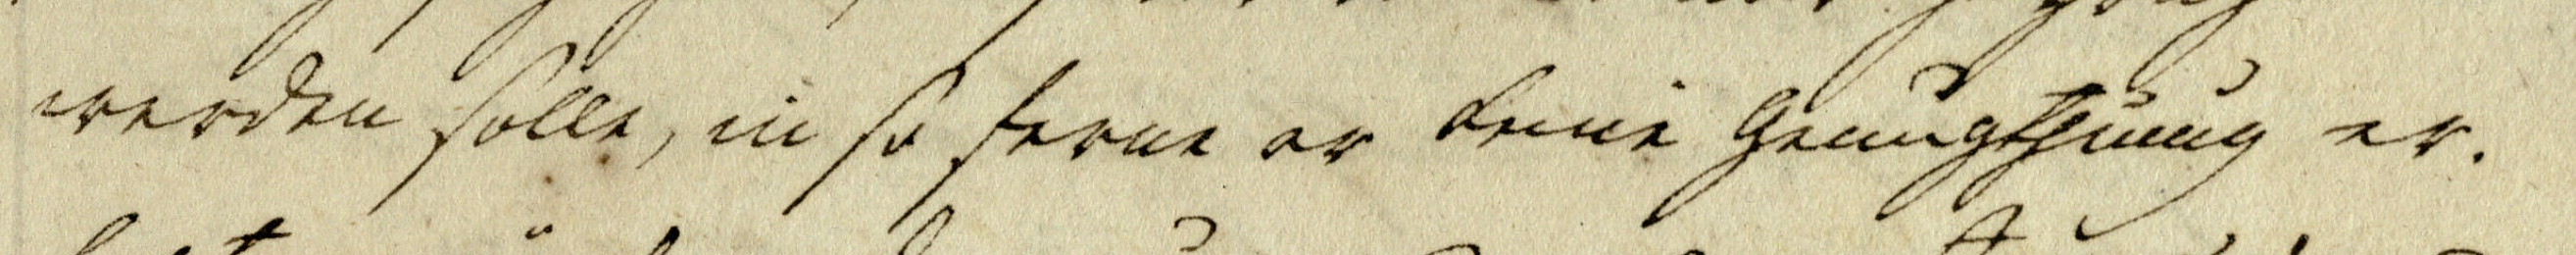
werden solle, in so ferne er keine Genugthuung er¬
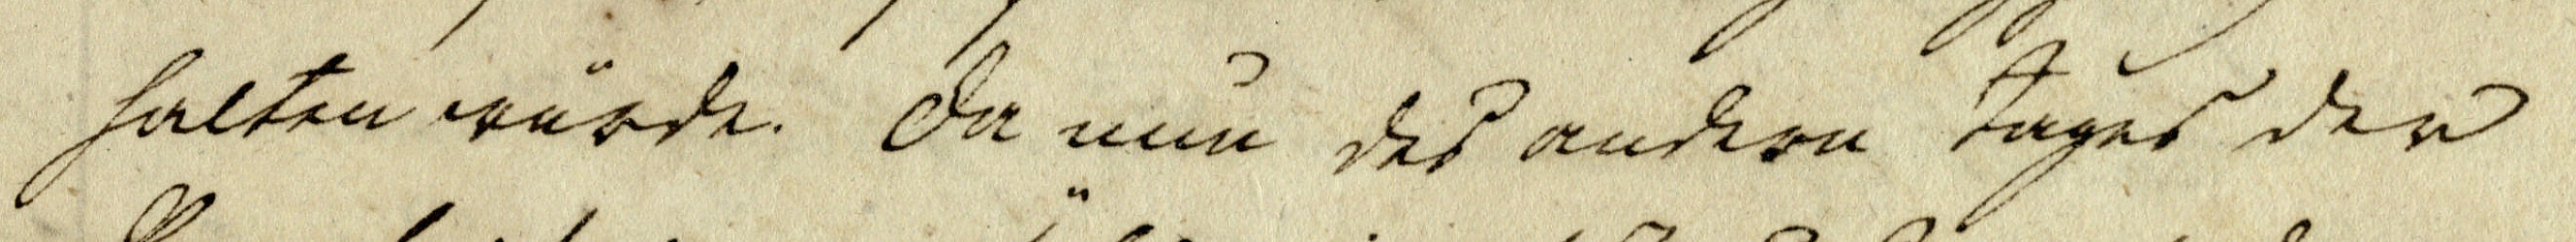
halten würde. Da nun des andern Tages der
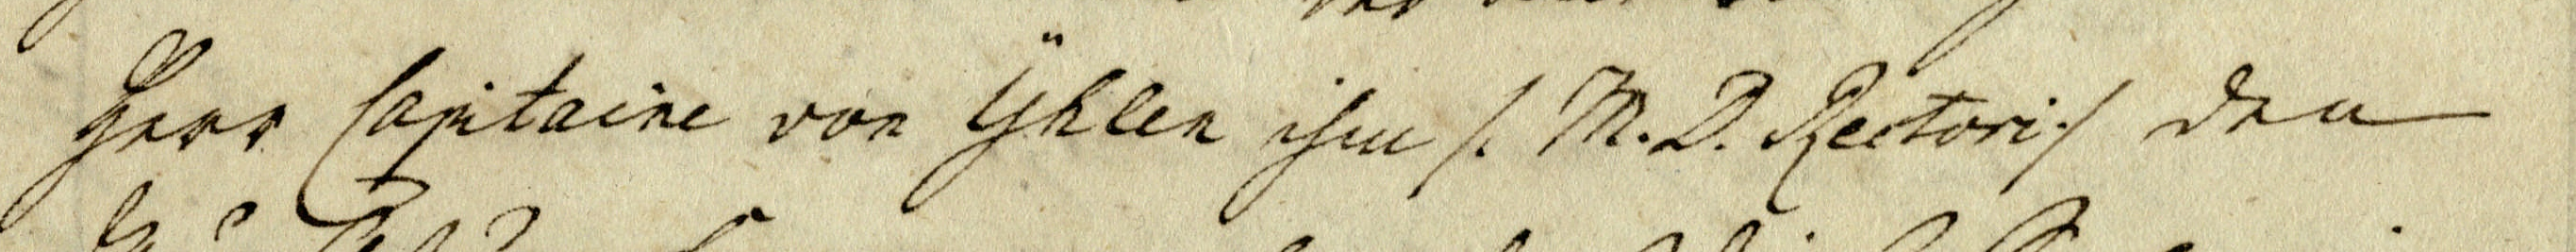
Herr Captaine von Ÿhlen ihm /: M. D. Rectori :/ den
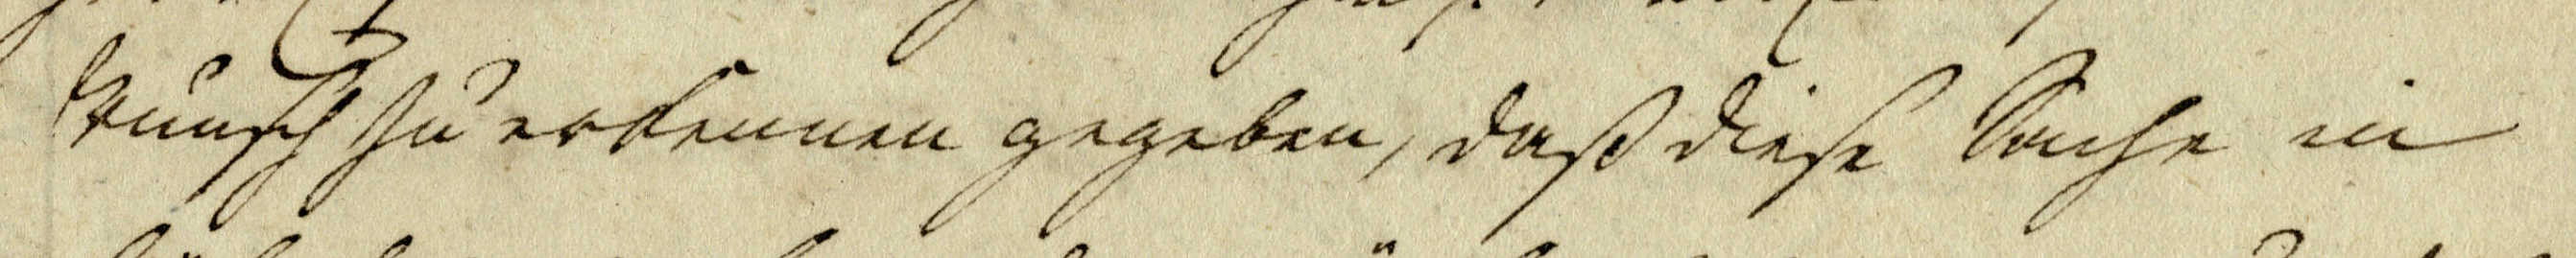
Wunsch zu erkennen gegeben, daß diese Sache in
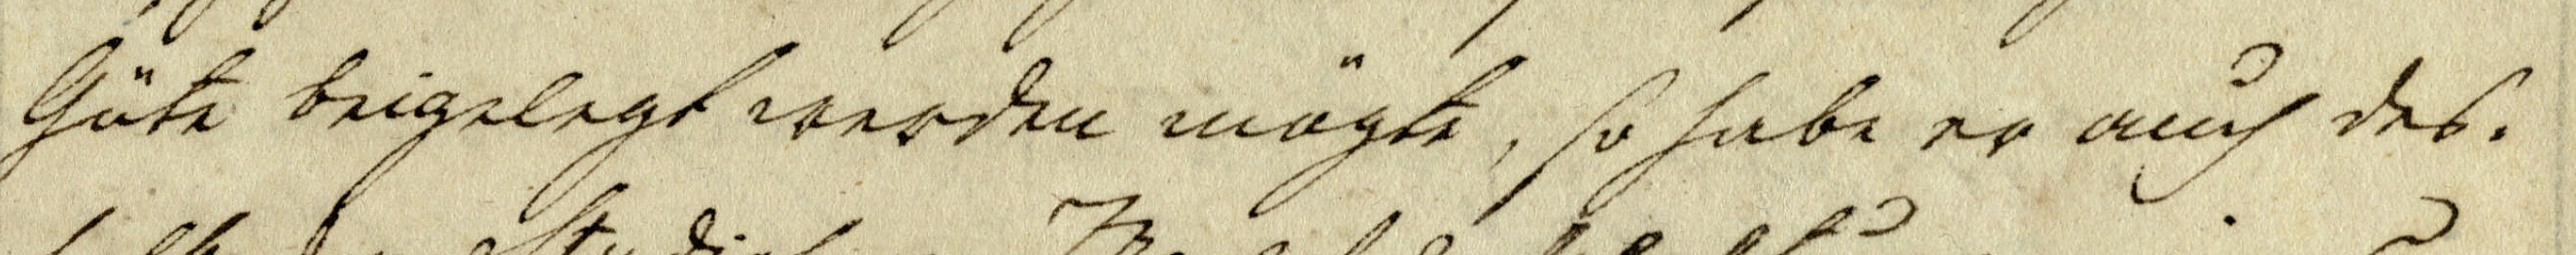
Güte beigelegt werden mögte, so habe er auch des¬
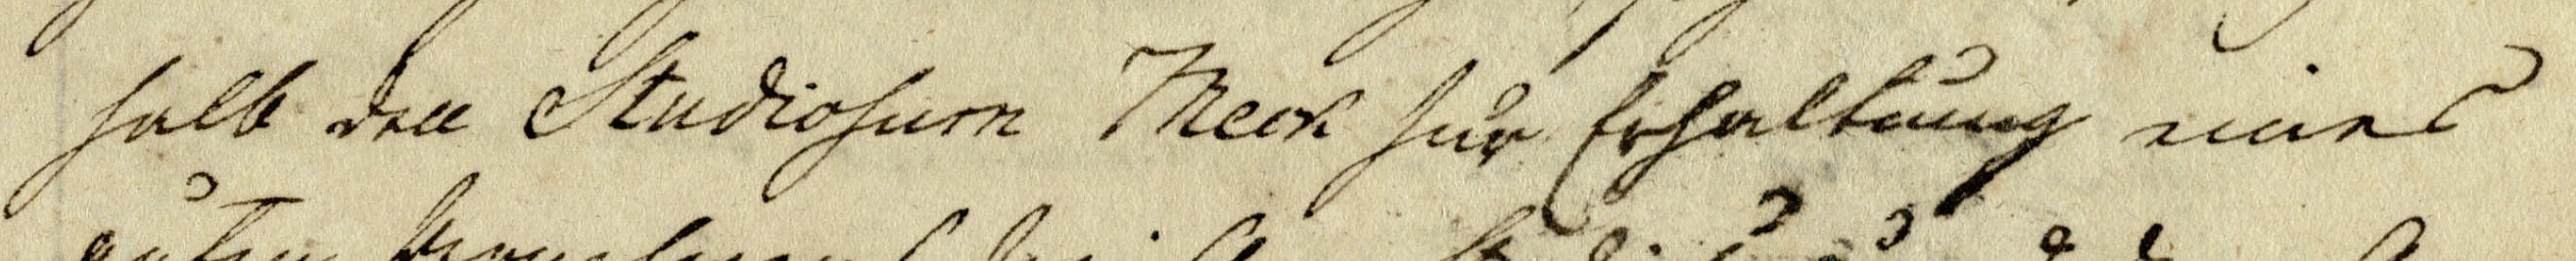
halb den Studiosum Meck zur Erhaltung eines
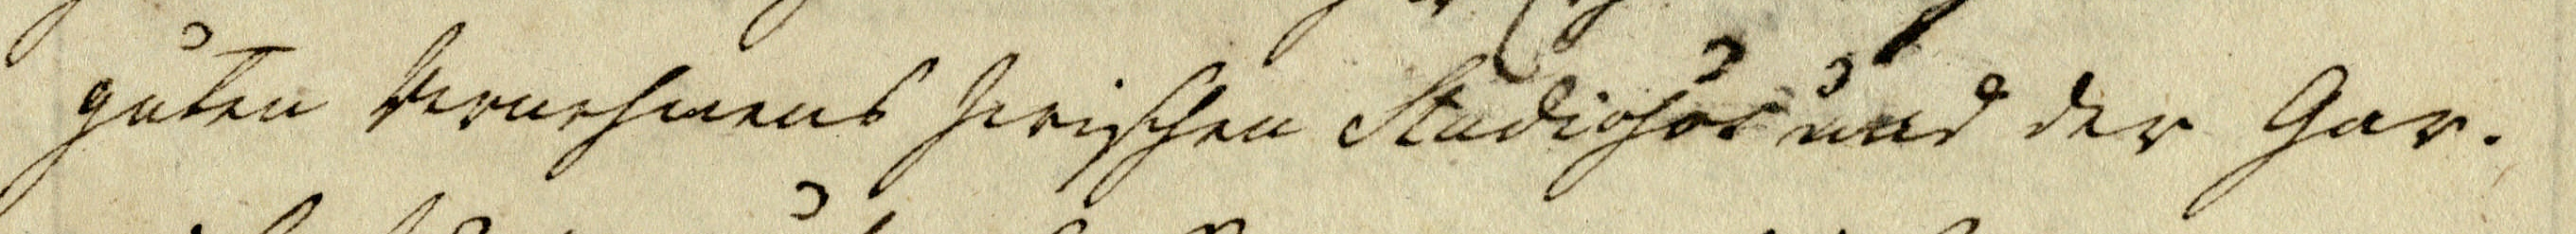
guten Vernehmens zwischen Studiosos und der Gar¬
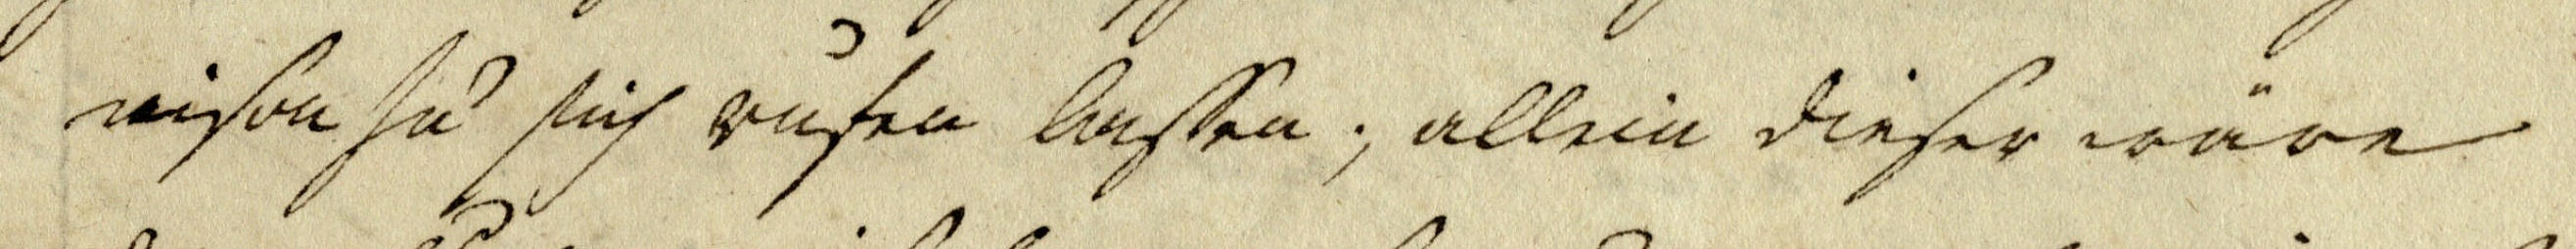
nison zu sich vufen lassen; allein dieser wäre
